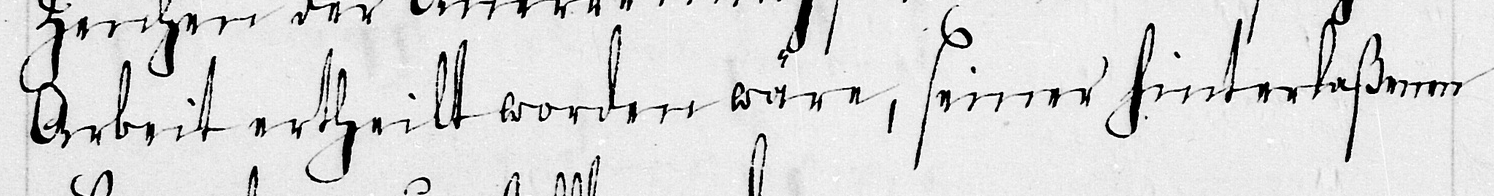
Arbeit ertheilt worden wäre, seiner hinterlaßenenen
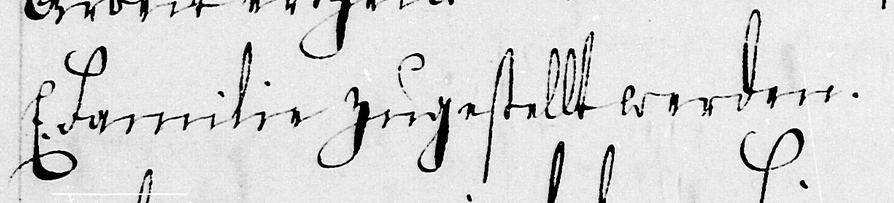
Familie zugestellt werden.
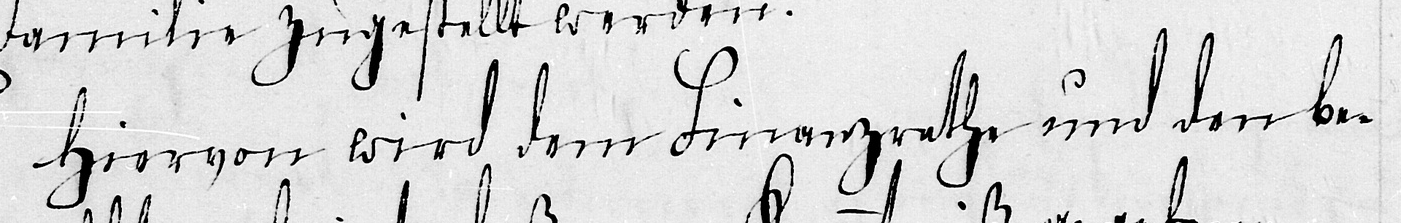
Hiervon wird dem Finanzrathe und den be¬
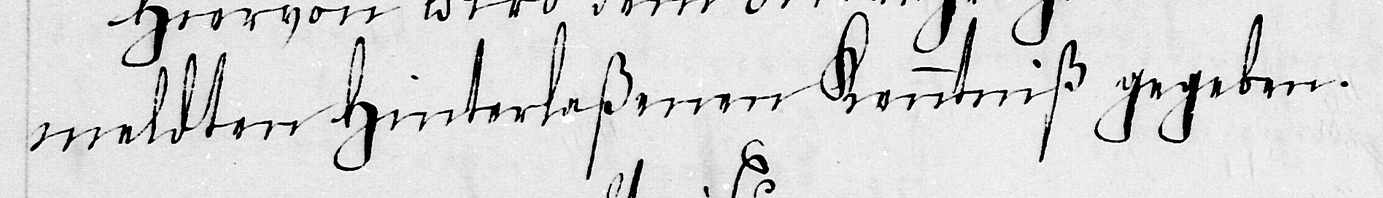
meldten Hinterlaßenen Kenntniß gegeben.
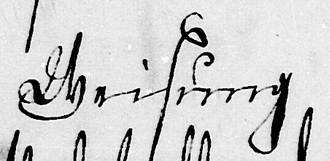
Weisung
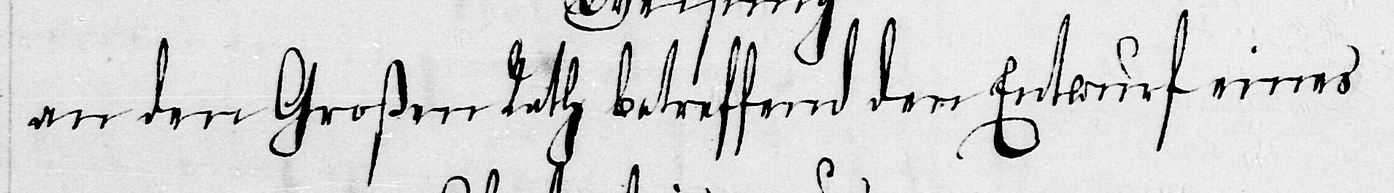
an den Großen Rath betreffend den Entwurf eines
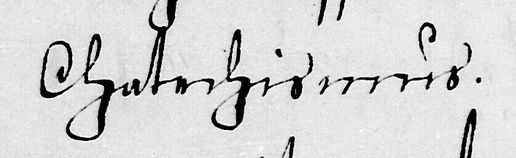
Chatechismus.
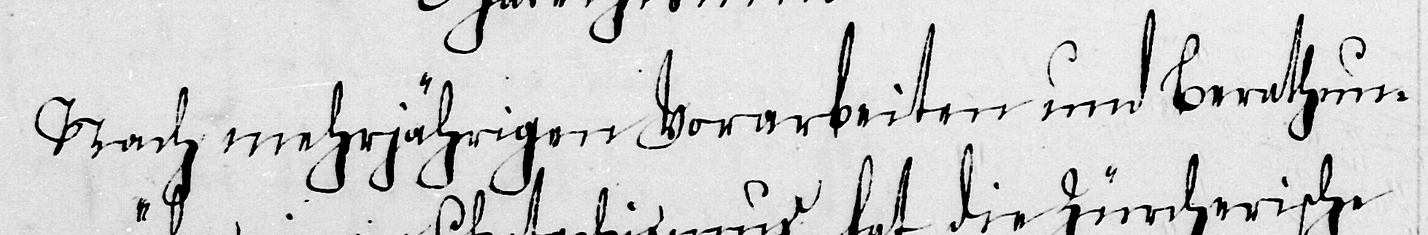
Nach mehrjährigen Vorarbeiten und Berathun¬
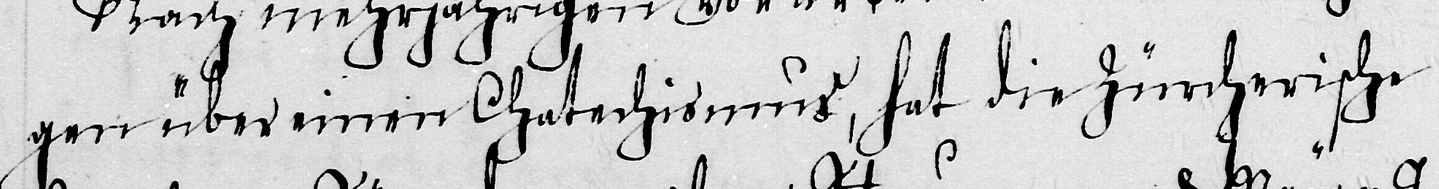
gen über einen Chatechismus, hat die Zürcherische
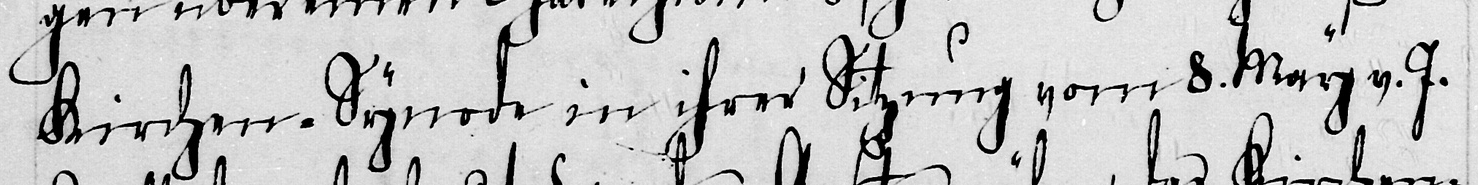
Kirchen-Synode in ihrer Sitzung vom 8. May v. J.
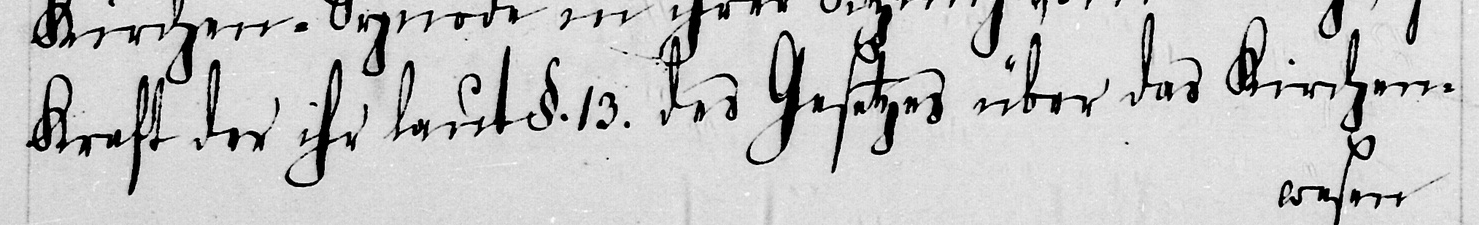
Kraft des ihr laut §. 13. des Gesetzes über das Kirchen-
